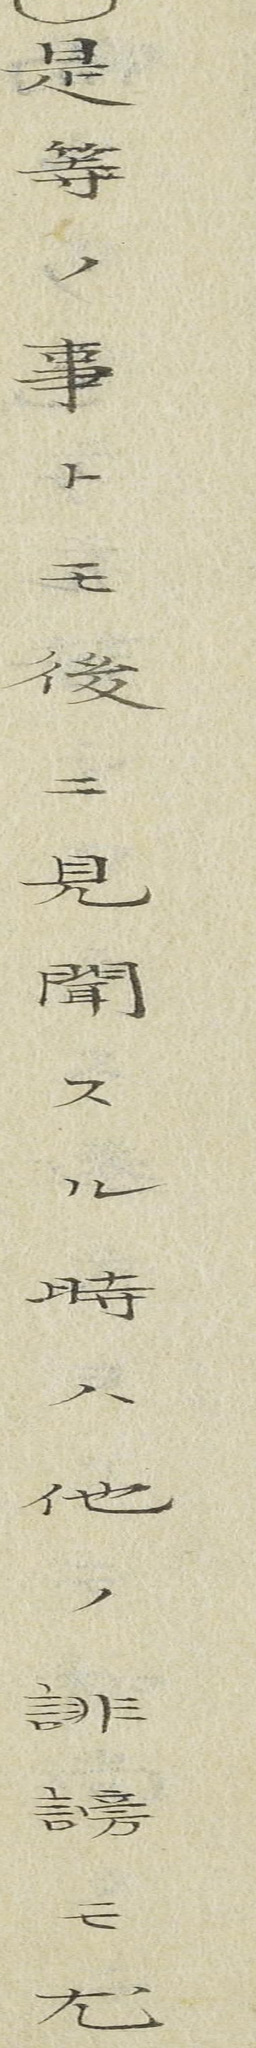〇是等ノ事トモ後ニ見聞スル時ハ他ノ誹謗モ尤
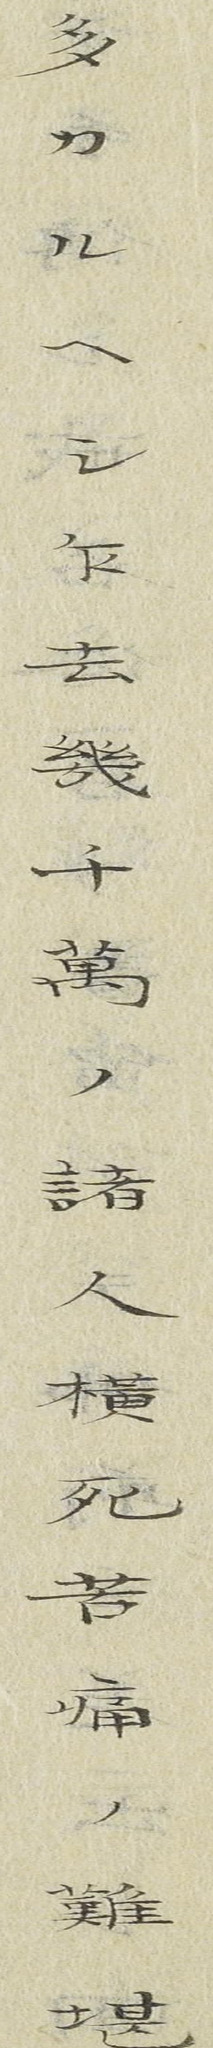多カルヘシ乍去幾千万ノ諸人横死苦痛ノ難堪
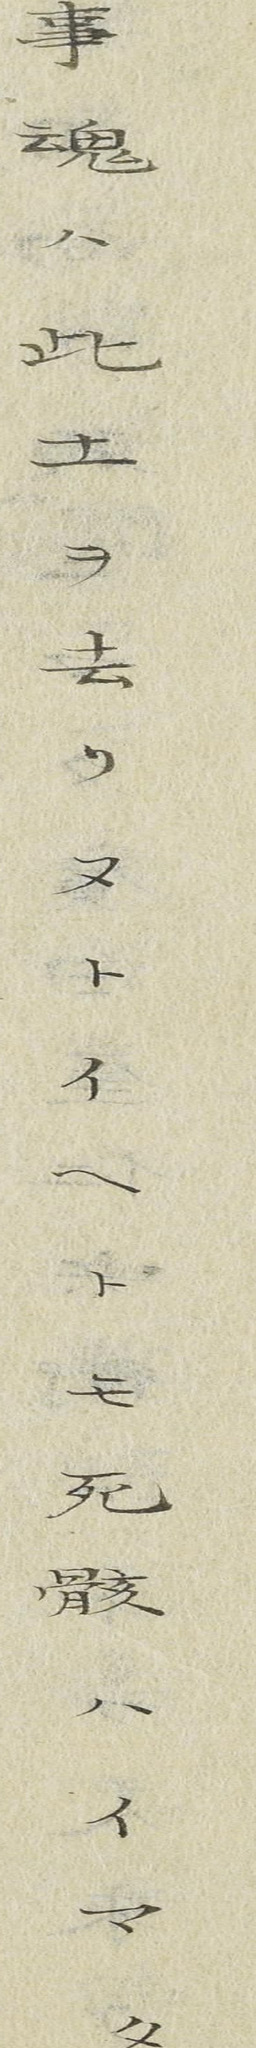事魂ハ此土ヲ去リヌトイヘトモ死骸ハイマタ
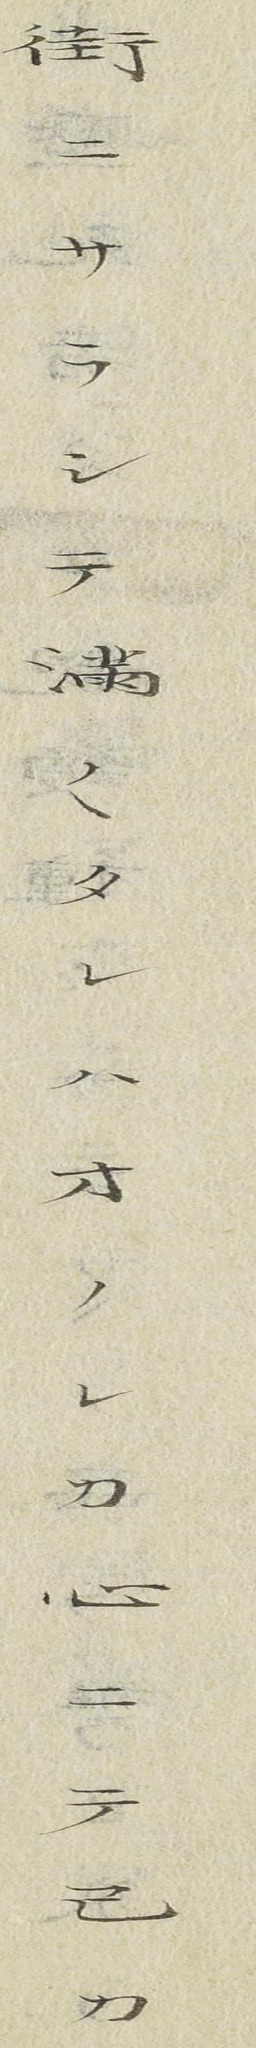街ニサラシテ満〱タレハオノレカ心ニテ己カ
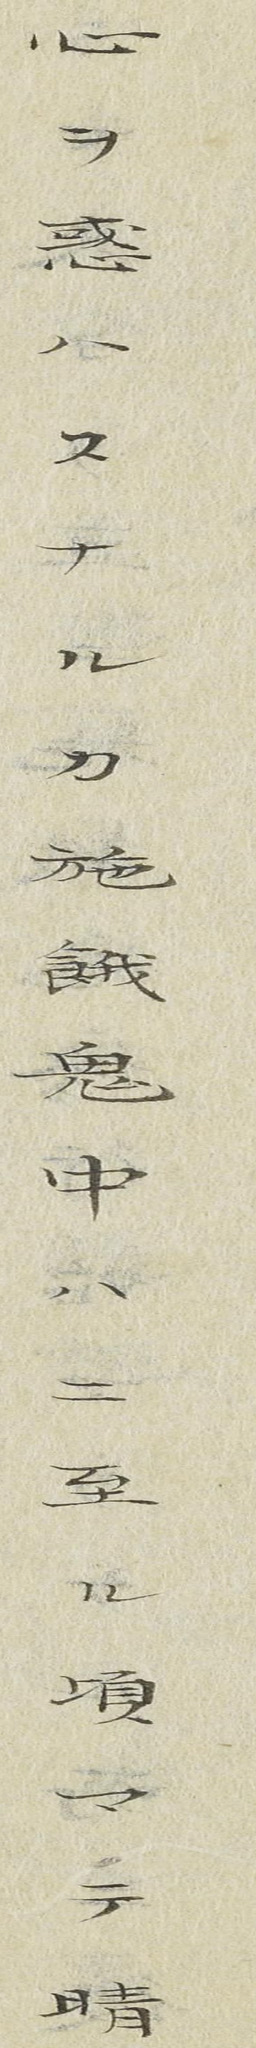心ヲ惑ハスナルカ施餓鬼中ハニ至ル頃マテ晴
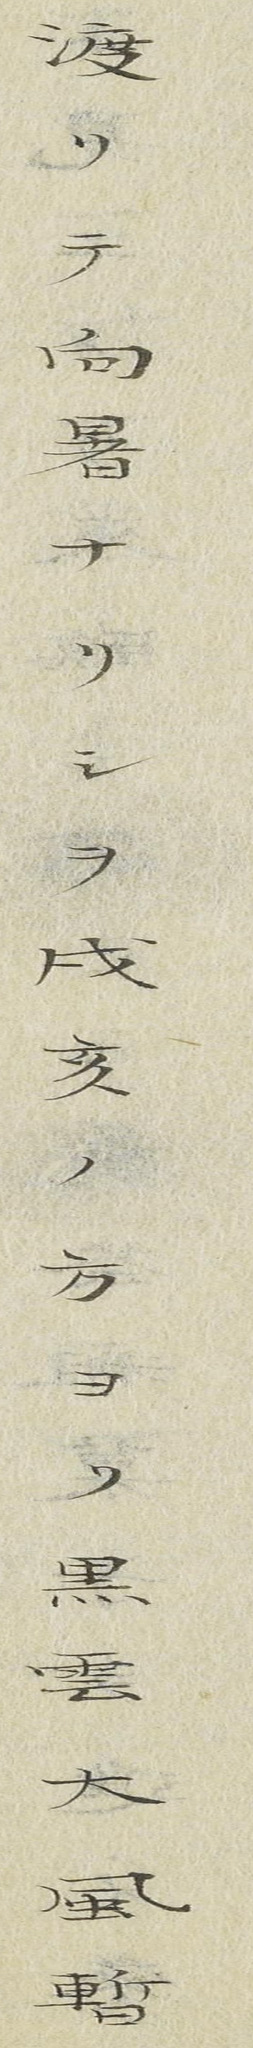渡リテ向暑ナリシヲ戌亥ノ方ヨリ黒雲大風暫
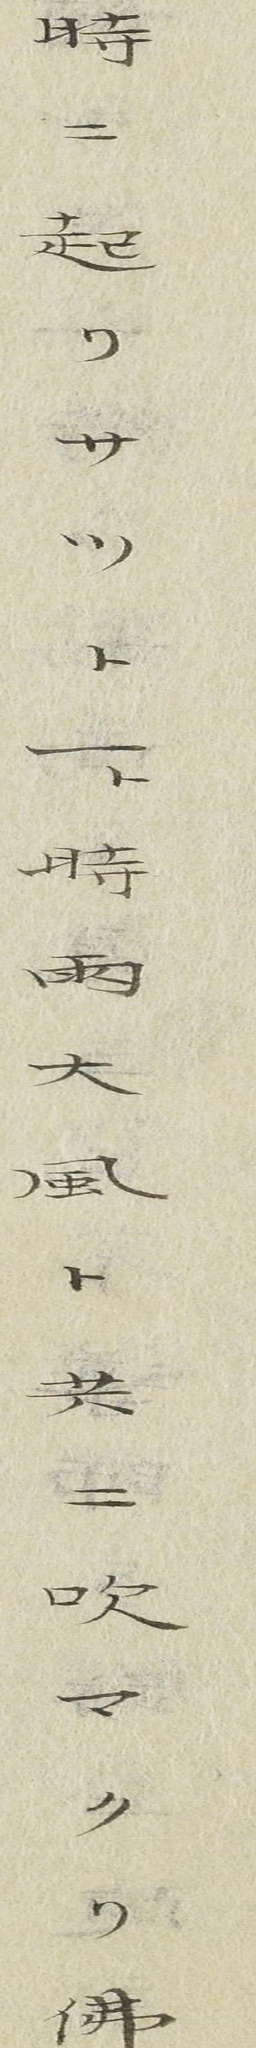時ニ起リサツト一ト時雨大風ト共ニ吹マクリ仏
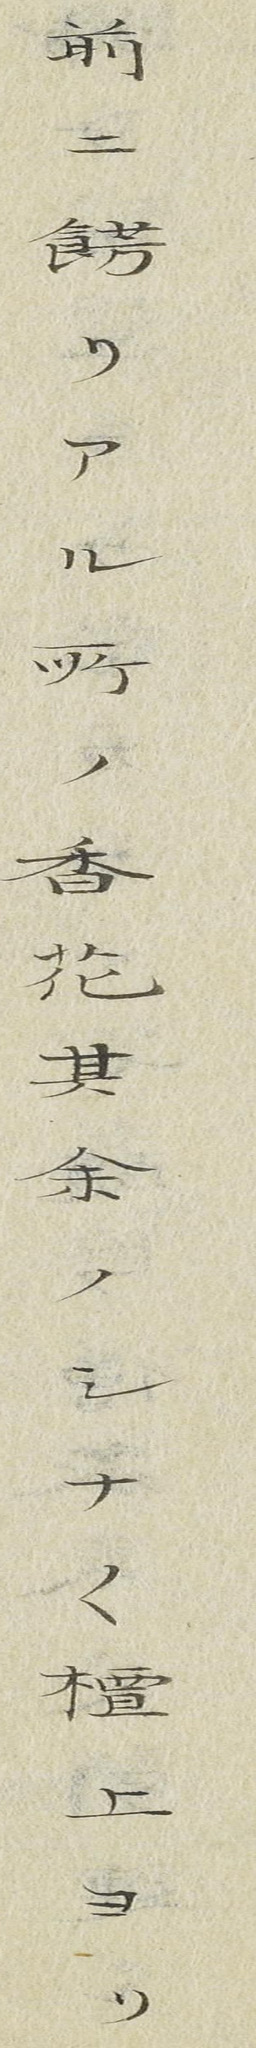前ニ餝リアル所ノ香花其余ノシナ〱檀上ヨリ
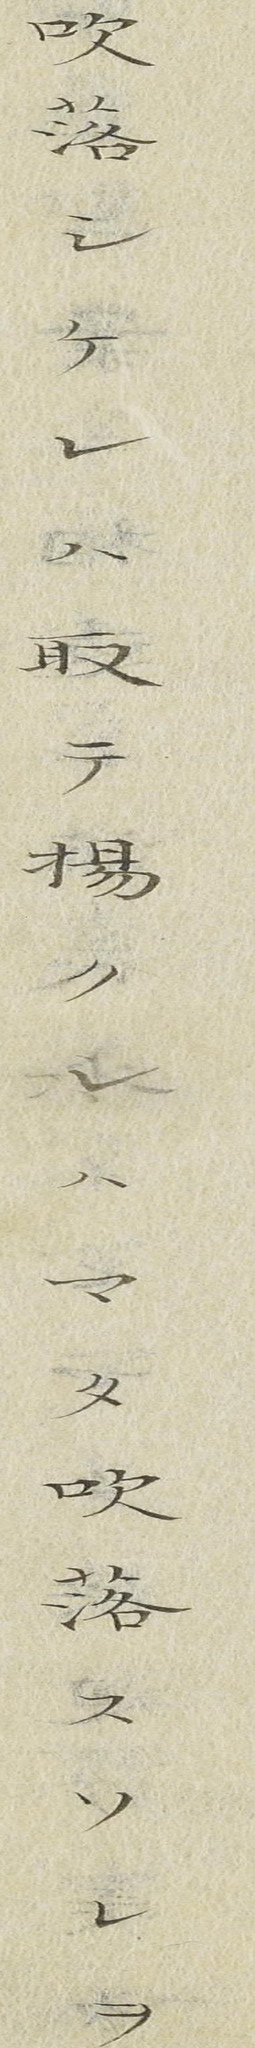吹落シケレハ取テ揚クレハマタ吹落スソレヲ
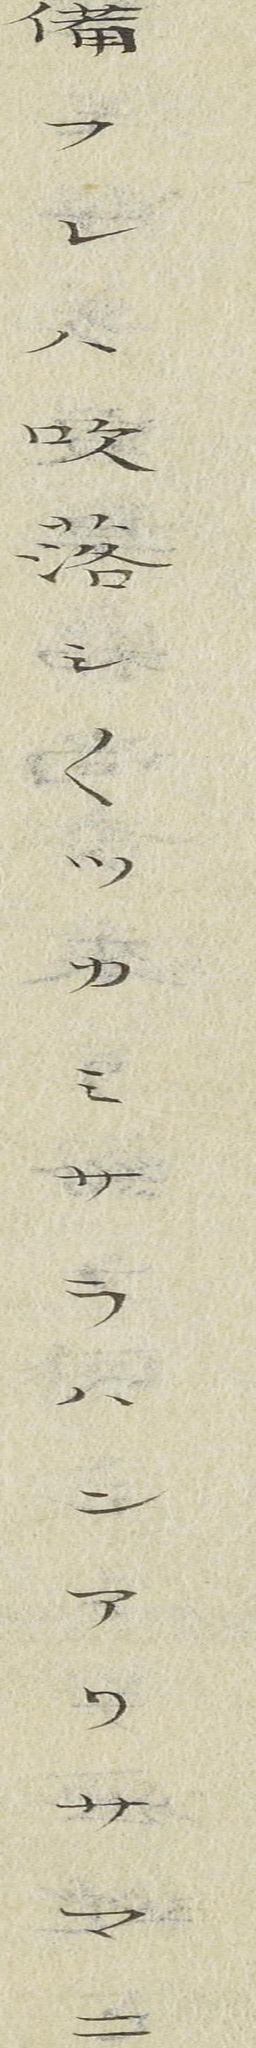備フレハ吹落シ〱ツカミサラハンアリサマニ
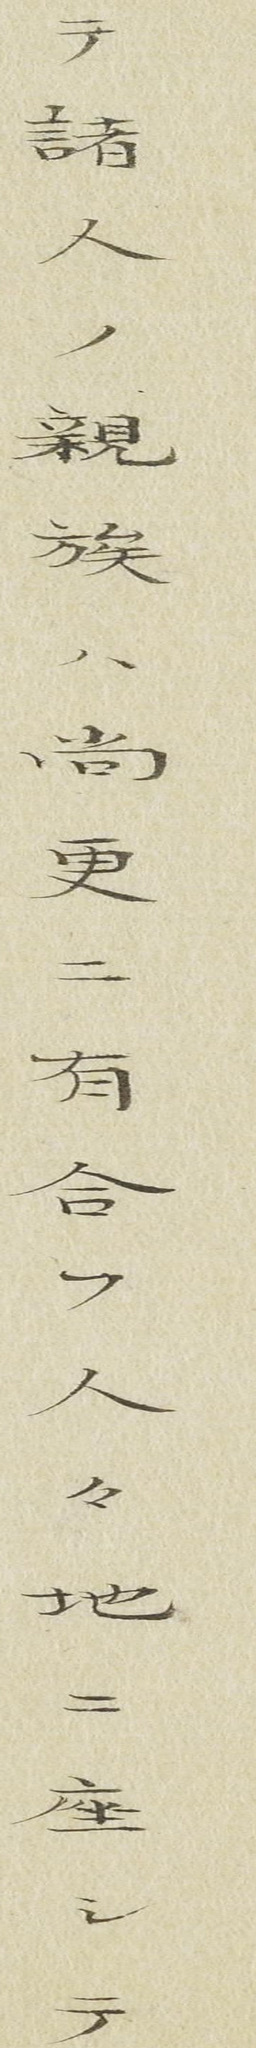テ諸人ノ親族ハ尚更ニ有合フ人々地ニ座シテ
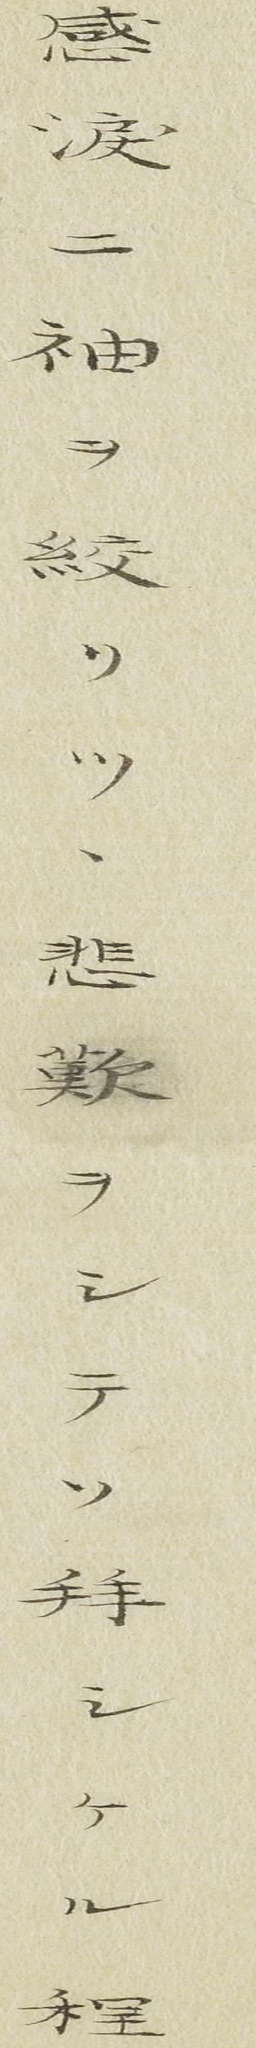感涙ニ袖ヲ絞リツヽ悲歎ヲシテソ拝シケル程
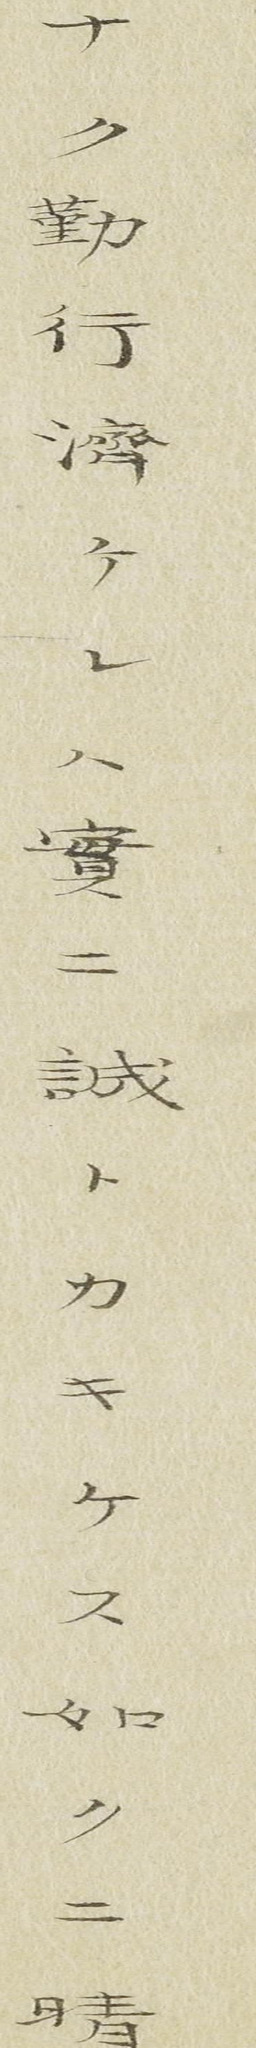ク勤行済ケレハ実ニ誠トカキスケス如クニ晴
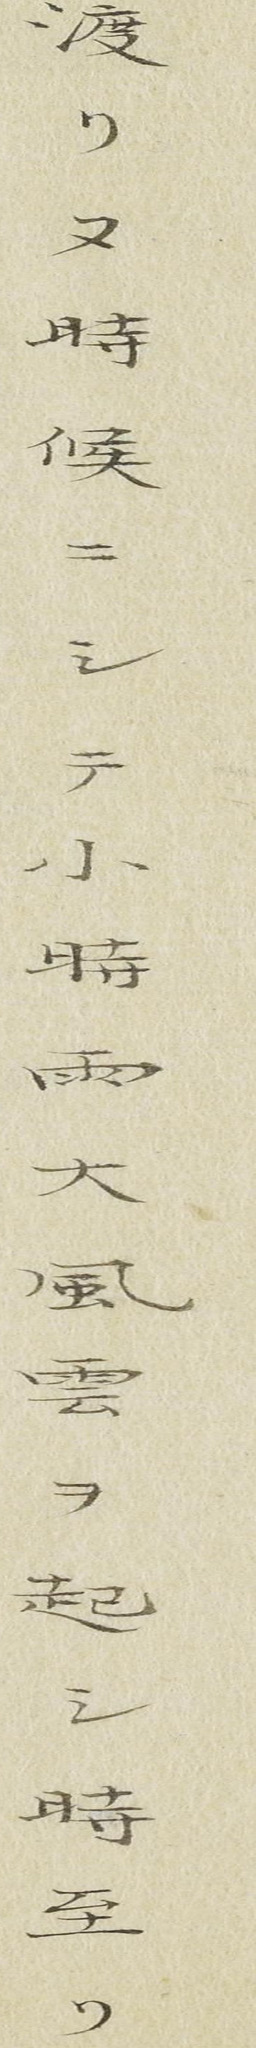渡リヌ時候ニシテ小時雨大風曇ヲ起シ時至リ
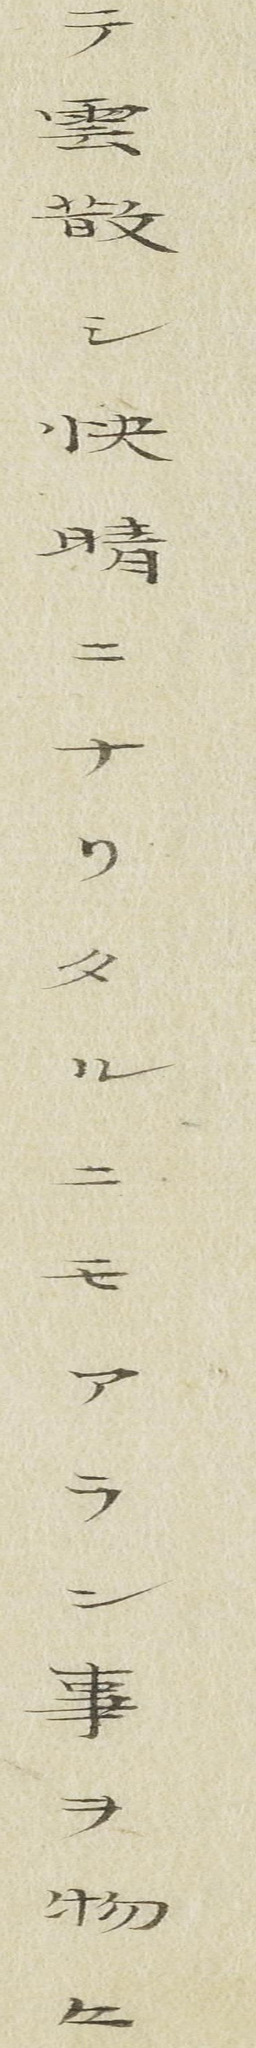テ曇散シ快晴ニナリタルニモアラン事ヲ物々
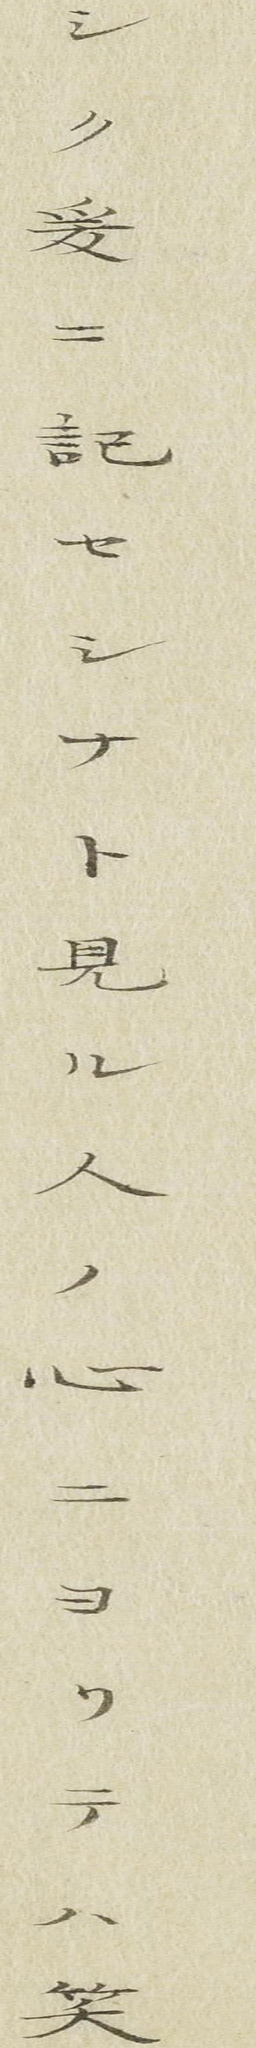シク爰ニ記セシナト見ル人ノ心ニヨリテハ笑
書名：地災撮要　地震之部　巻ノ二
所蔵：東京大学地震研究所図書室 Earthquake Research Institute Library, The University of Tokyo, JAPAN
